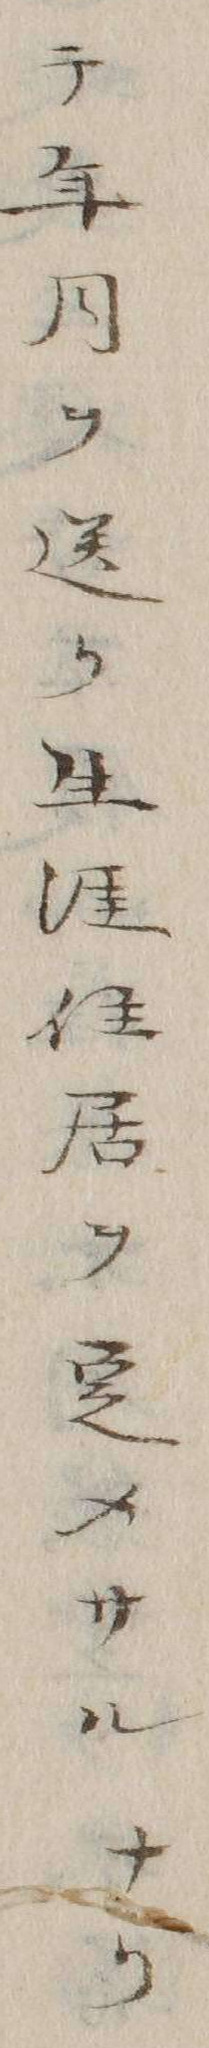テ年月ヲ送リ生涯住居ヲ定メサルナリ
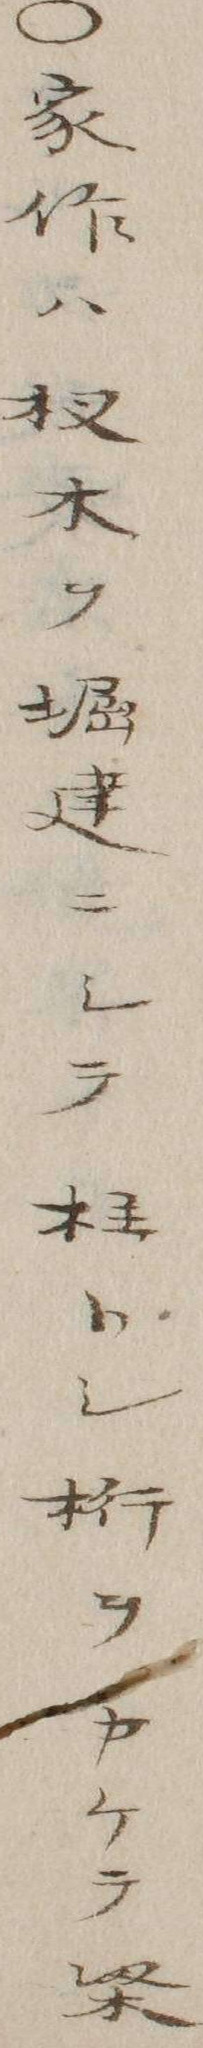〇家作ハ杈木ヲ掘建ニシテ柱トシ桁ヲカケテ梁
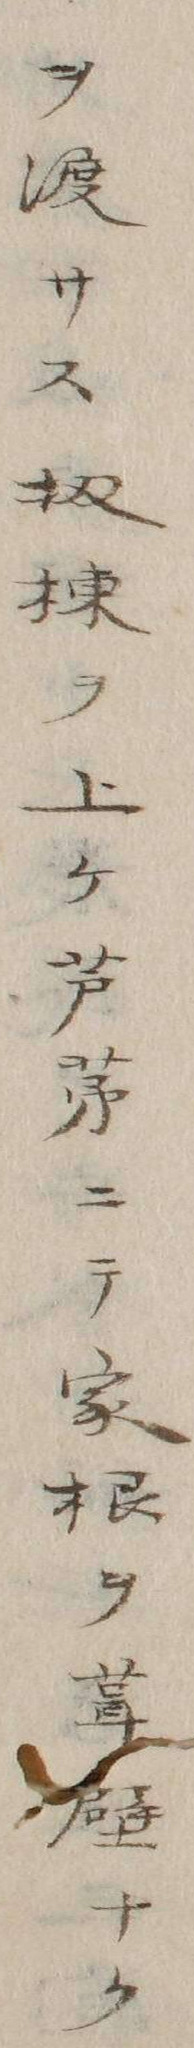ヲ渡サス扨棟ヲ上ケ芦茅ニテ家根ヲ葺壁ナク

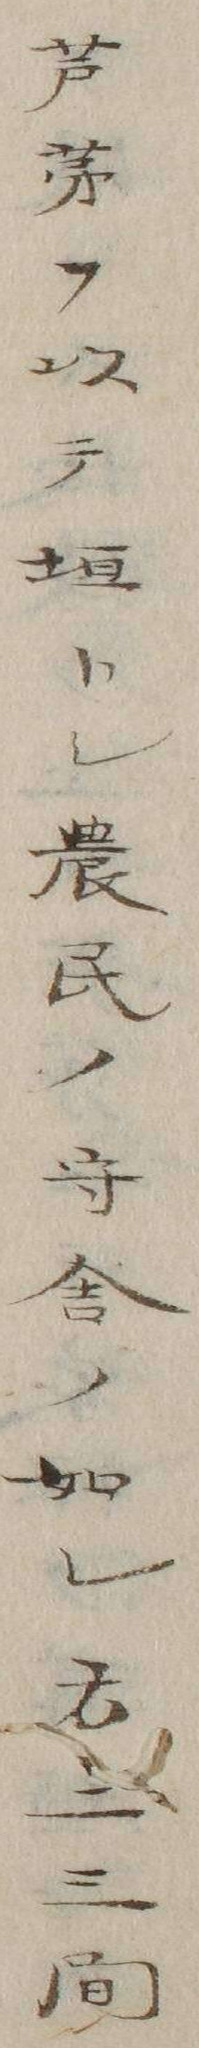芦茅ヲ以テ垣トシ農民ノ守舎ノ如シ方二三間
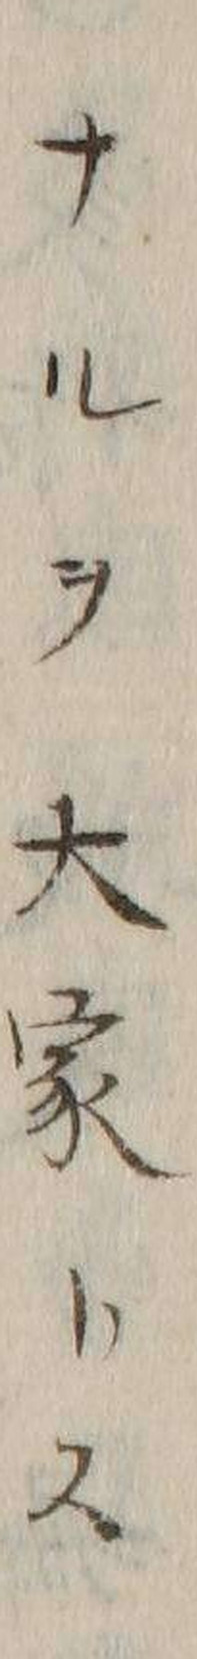ナルヲ大家トス
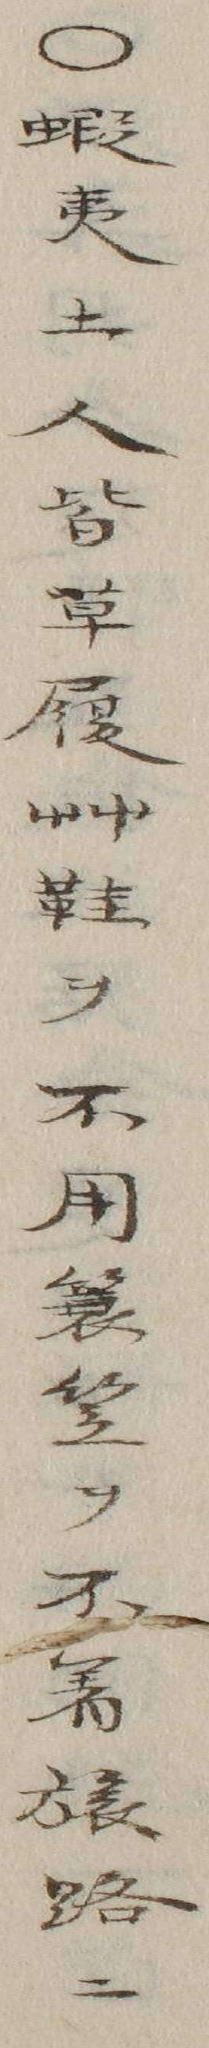〇蝦夷土人皆草履草鞋ヲ不用蓑笠ヲ不着旅路ニ
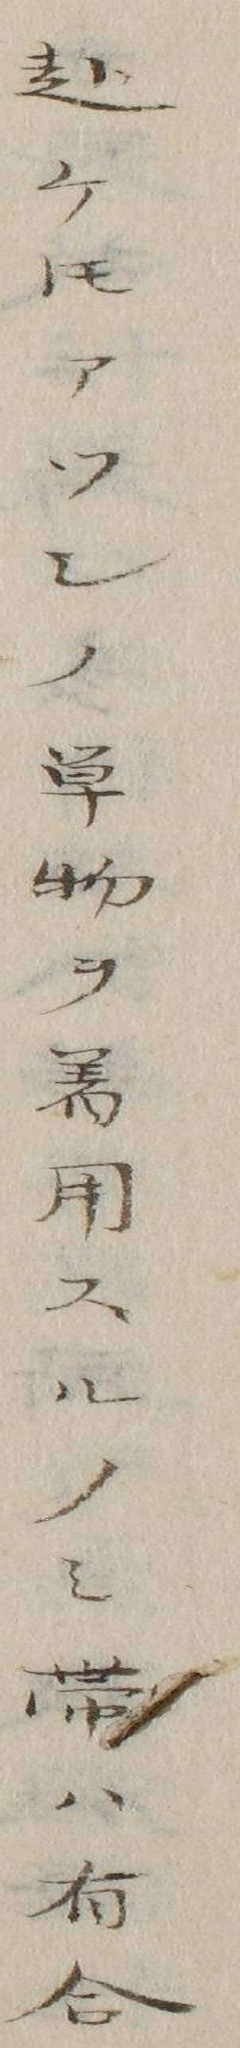趣け𪜈アツシノ単物ヲ着用スルノミ帯ハ有合
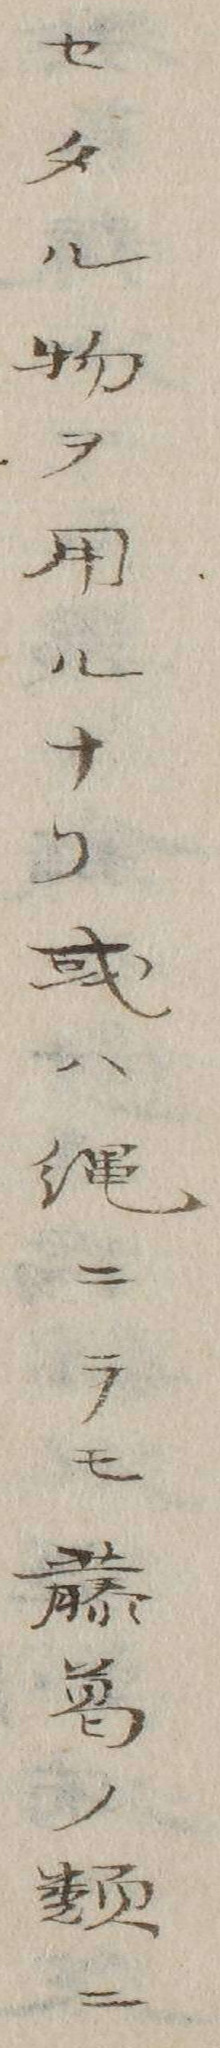セタル物ヲ用ルナリ或ハ縄ニテモ藤葛ノ類ニ
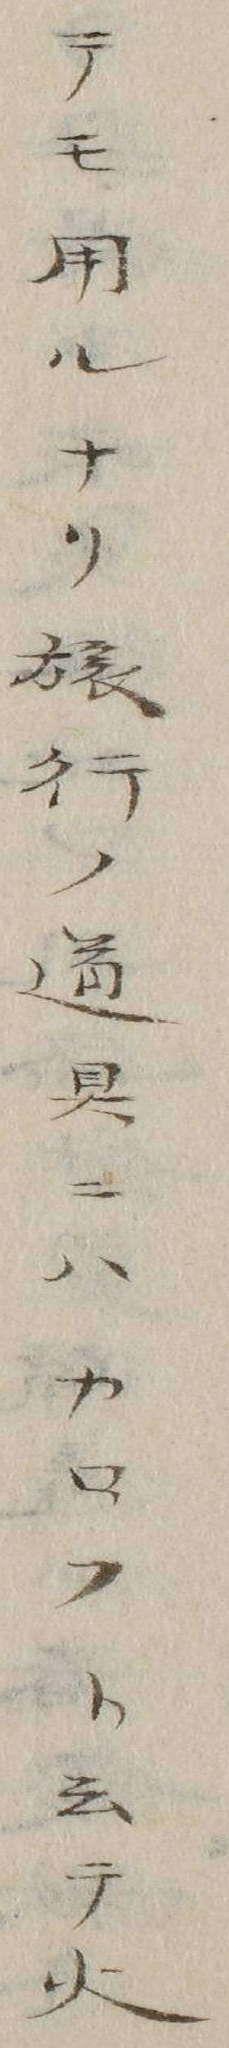テモ用ルナリ旅行ノ道具ニハカロフト云テ火
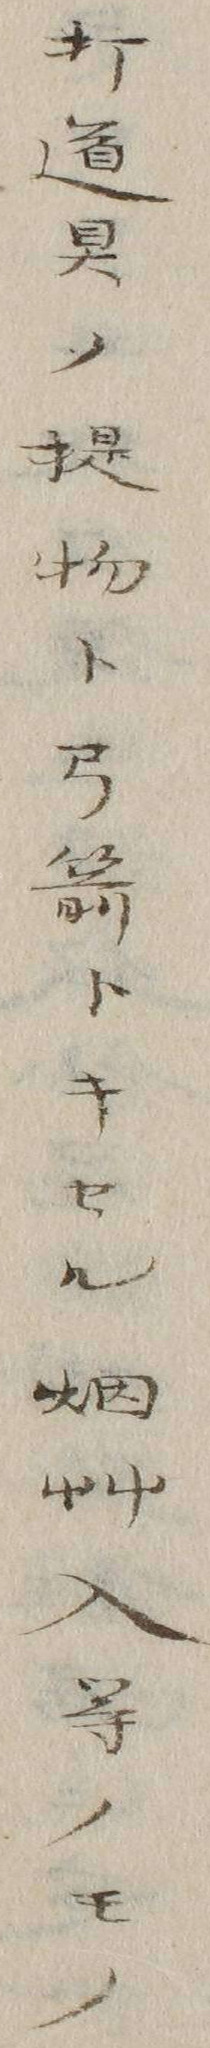打道具ノ提物ト弓箭トキセル煙草入等ノモノ
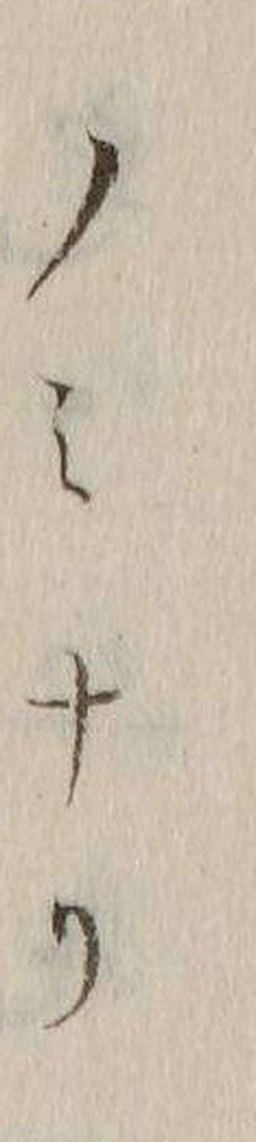ノミナリ
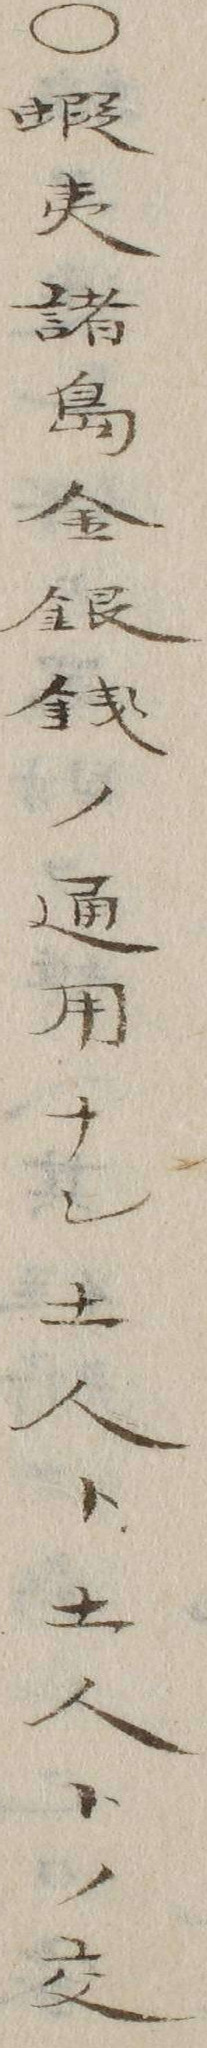〇蝦夷諸島金銀銭ノ通用ナシ土人ト土人トノ交
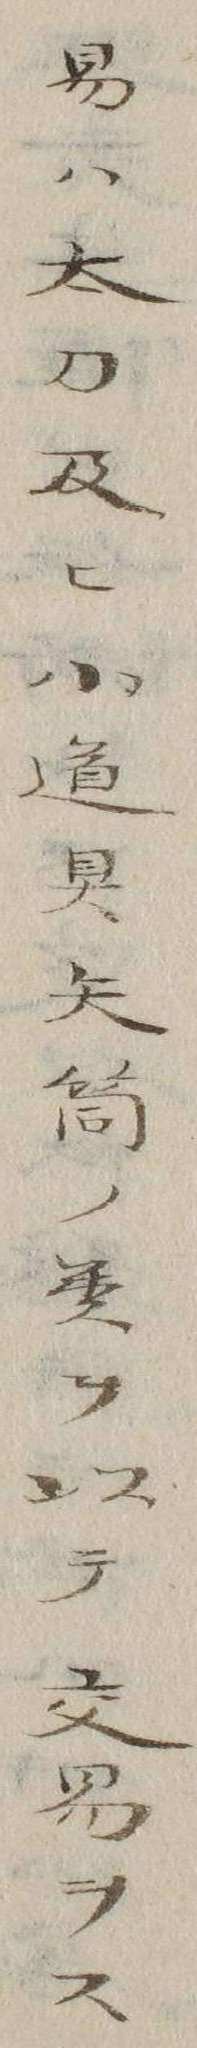易ハ太刀及ヒ小道具矢筒ノ類ヲ以テ交易ヲス
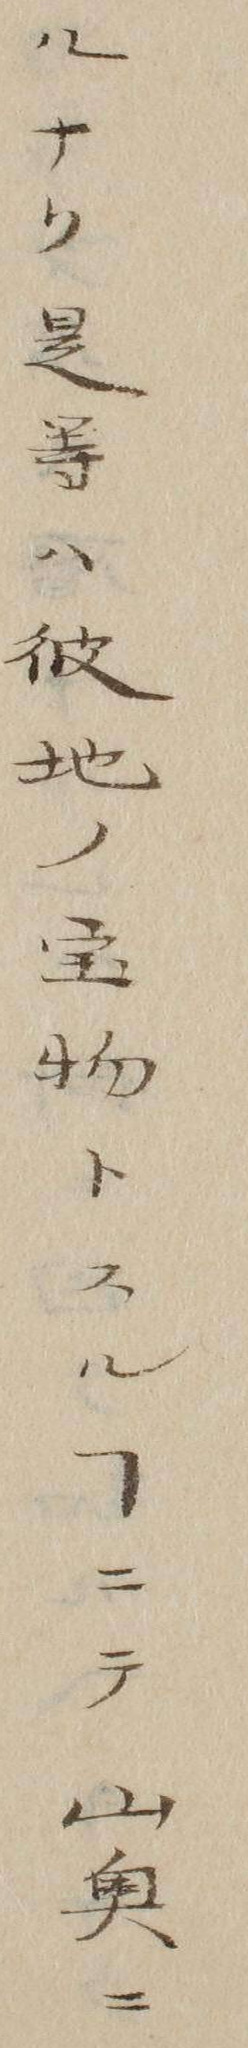ルナリ是等ハ彼地ノ宝物トスルヿニテ山奥ニ
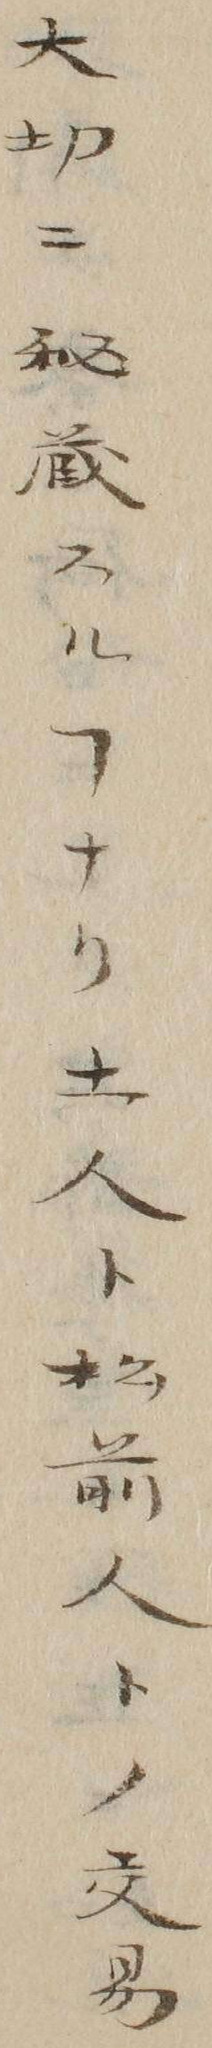大切ニ秘蔵スルヿナリ土人ト松前人トノ交易
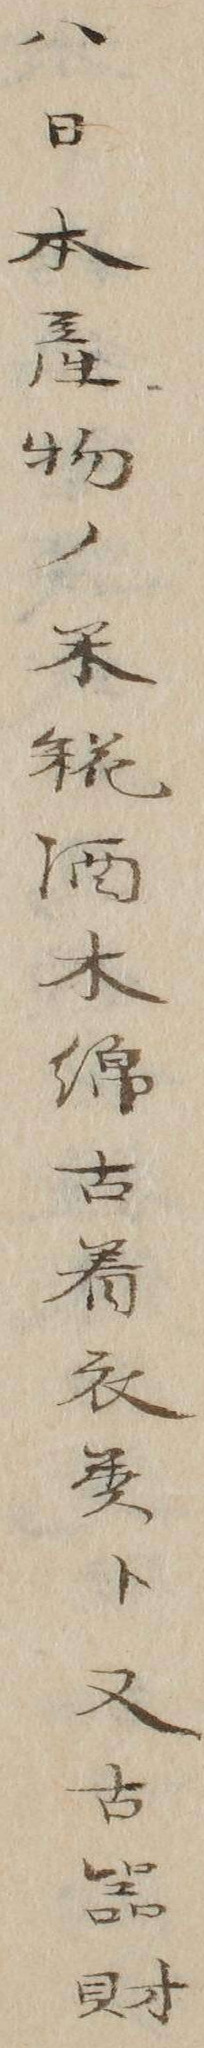ハ日本産物ノ米糀酒木綿古着衣類ト又古器財
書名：蝦夷草紙（国文学研究資料館）
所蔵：国文学研究資料館
